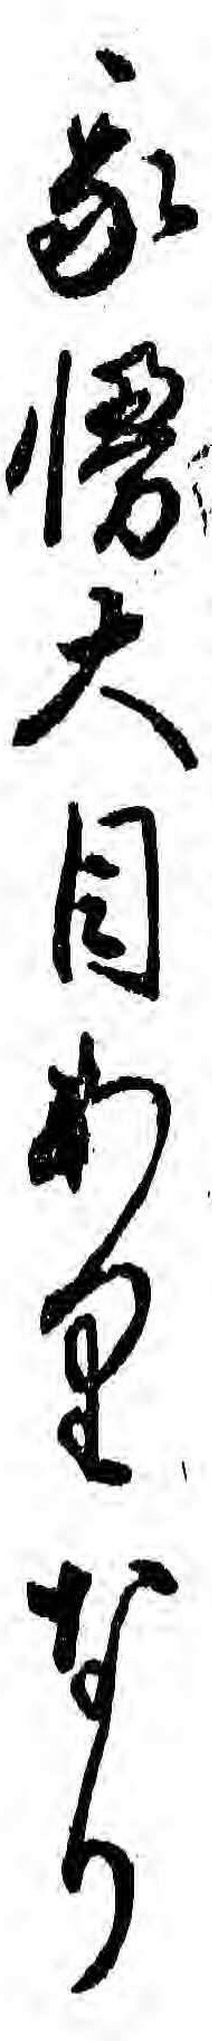我慢大目ありなり
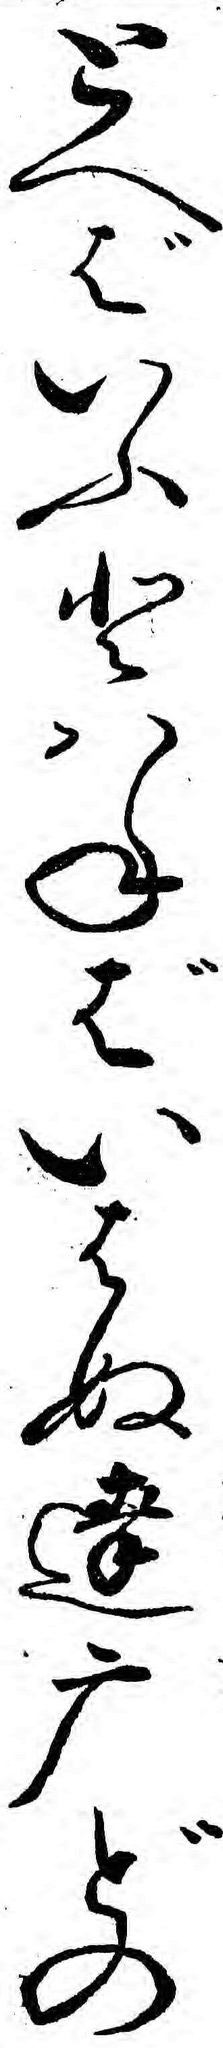とへばいふとはねばいはぬ達磨どの

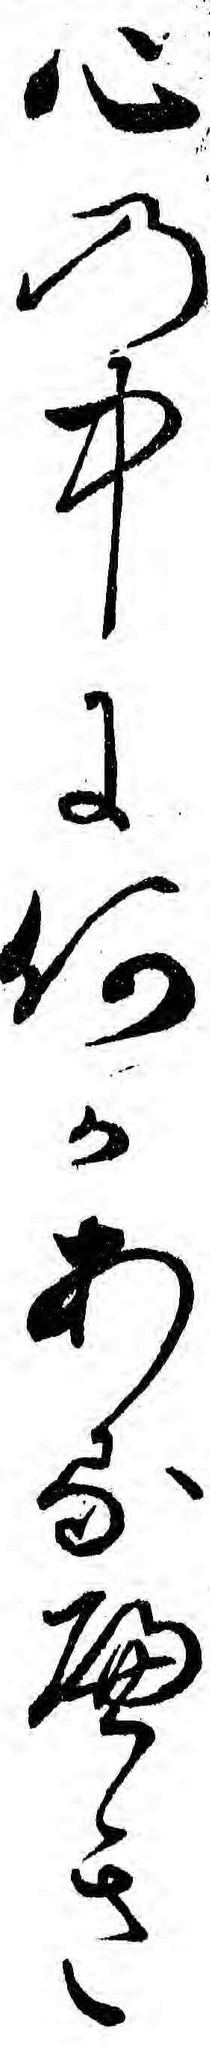心の中に何かあるへき
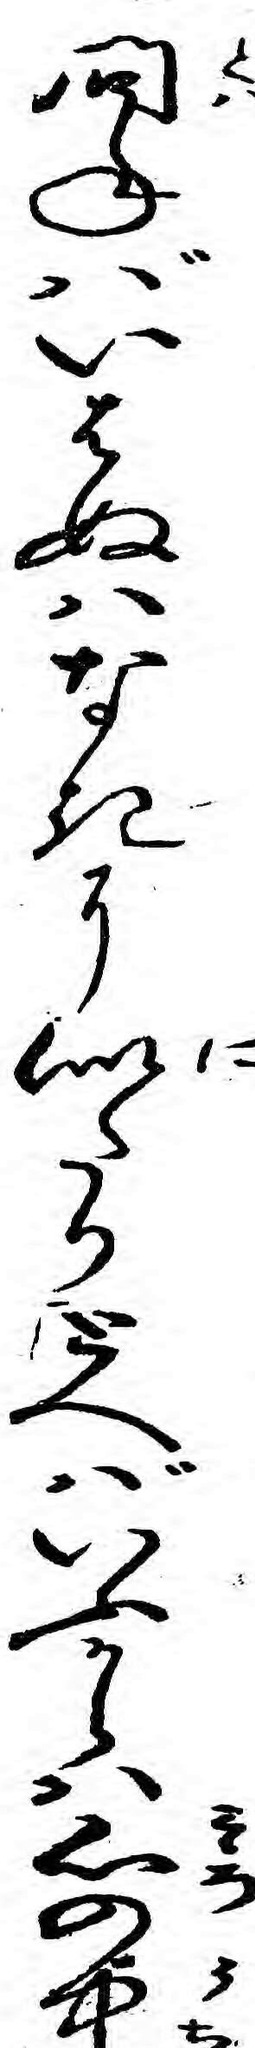問ねばいはぬはなきに似たりと人はいふからは心の中
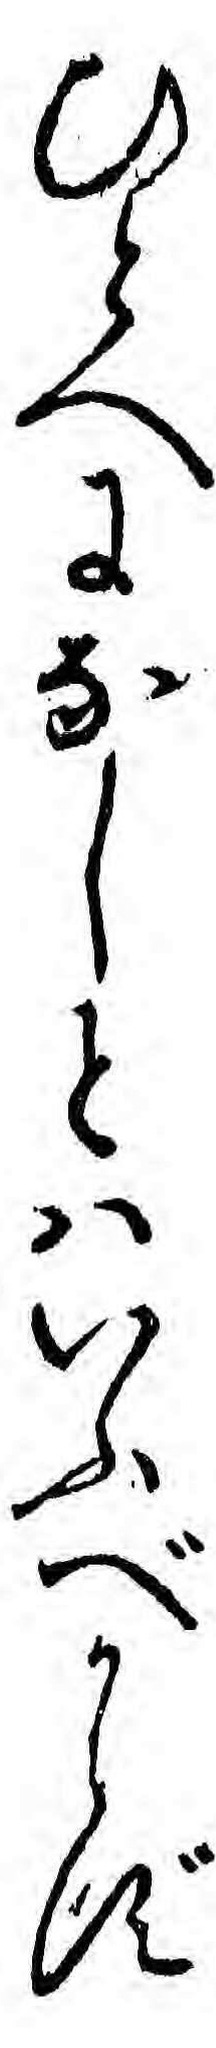ひとへになしとはいふべからず
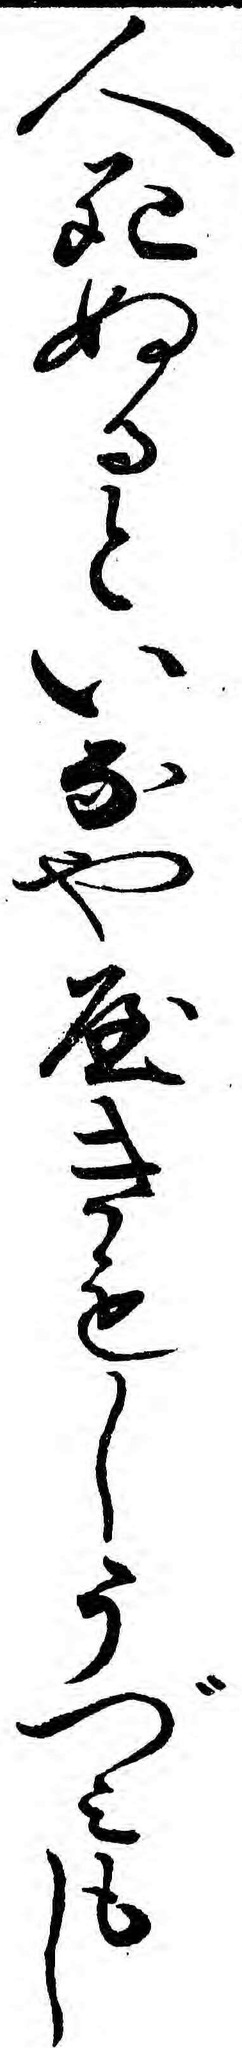人死ぬるといなやきしうづみもし
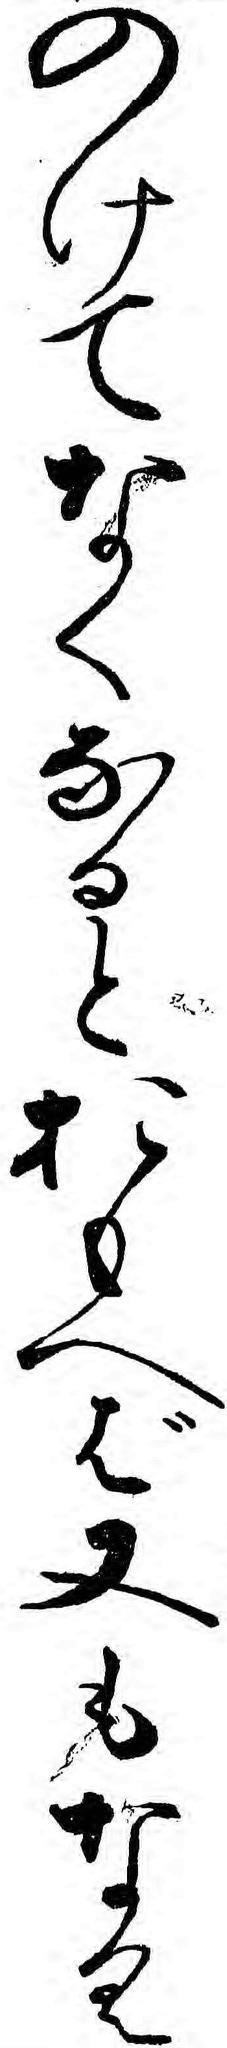のけてなくなるとおもへば又もなく
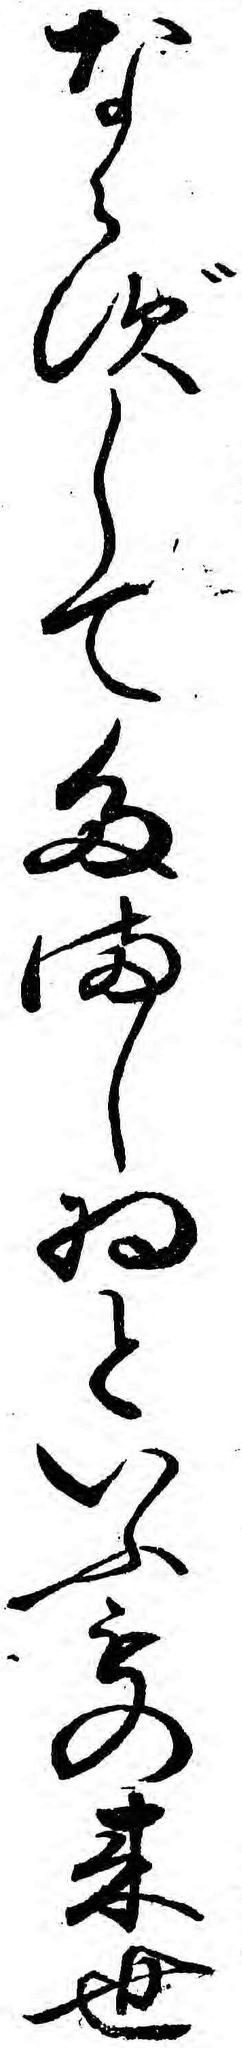ならずしてたましゐといふもの来世
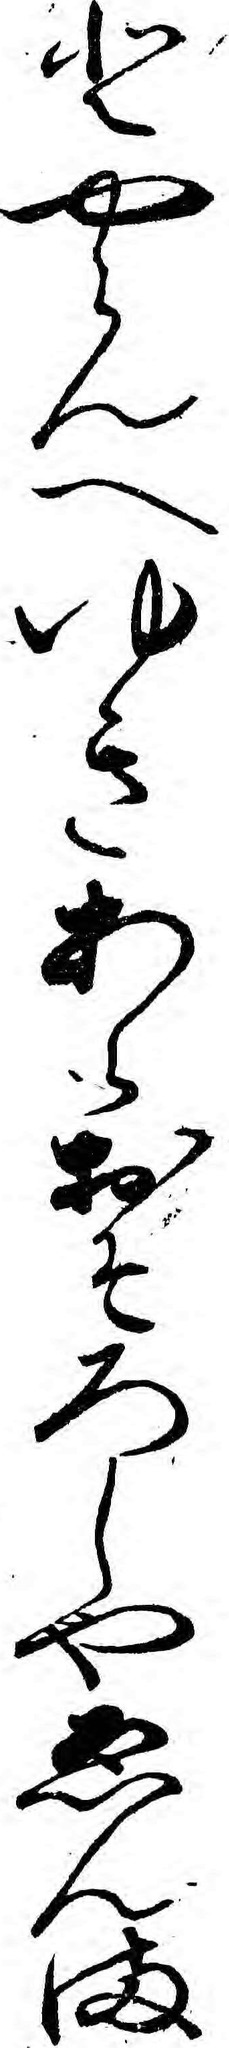とやらんへゆきあらおそろしやゑんま
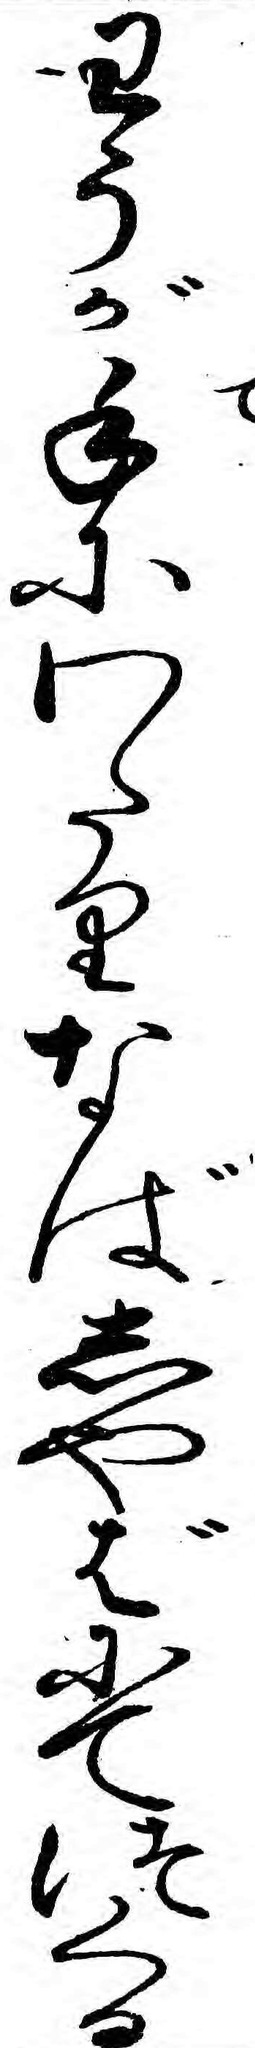わうが手にわたりなばしやばにてつくる
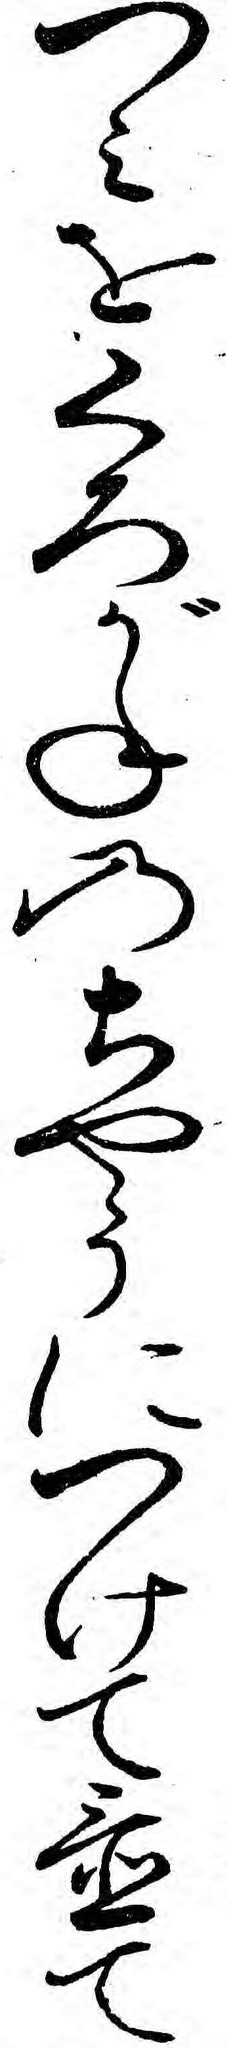つみをくろがねのちやうにつけて置て
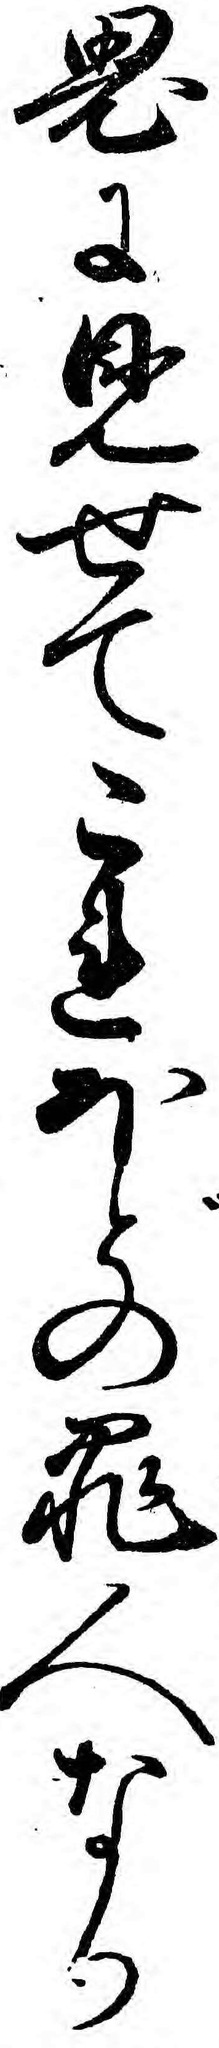鬼に見せてこれほどの罪人なり
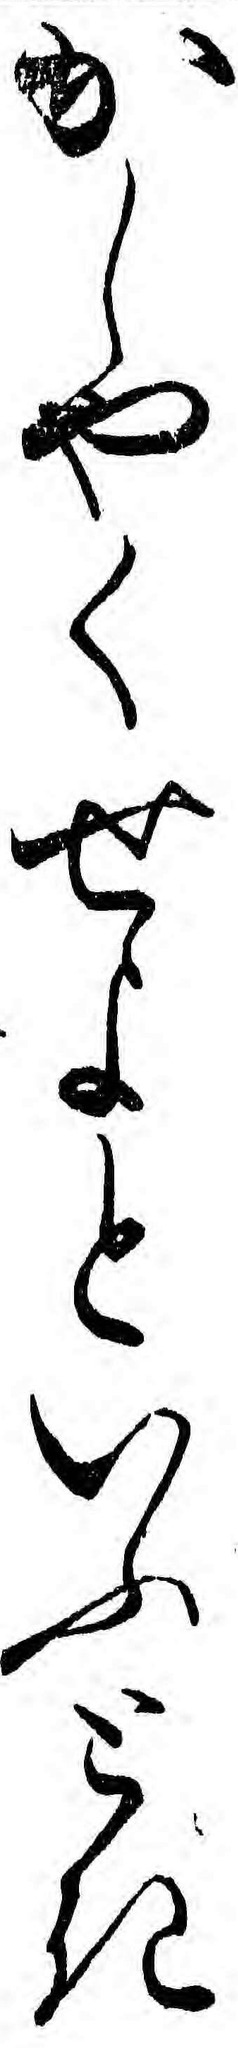かしやくせよといふとき
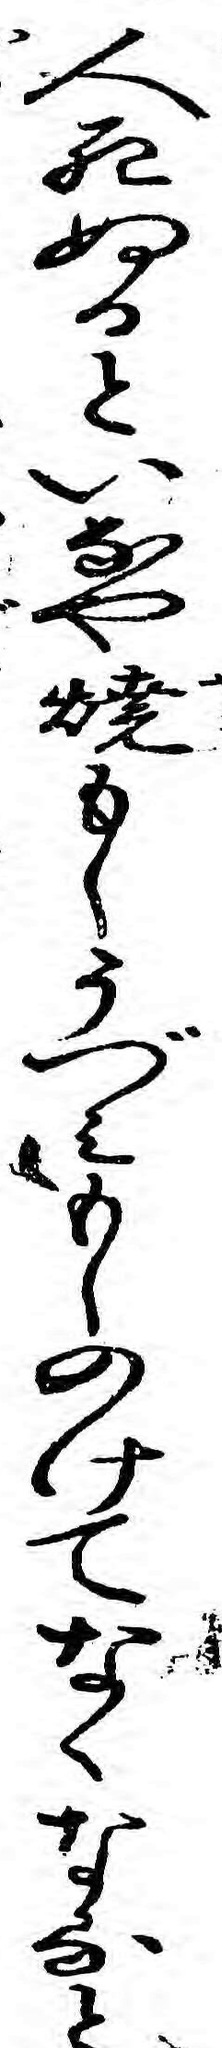人死ぬるといなや焼もしうづみもしのけてなくなると
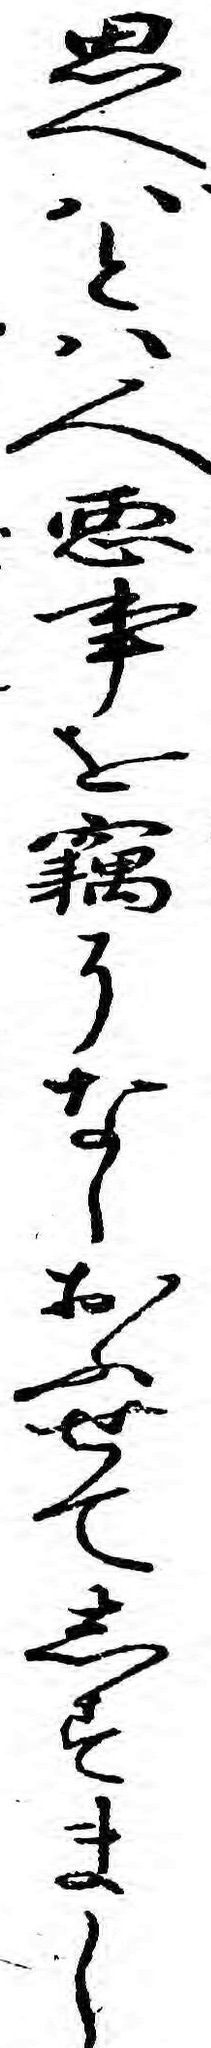思へばとは人悪事を竊になしおふせてしすまし
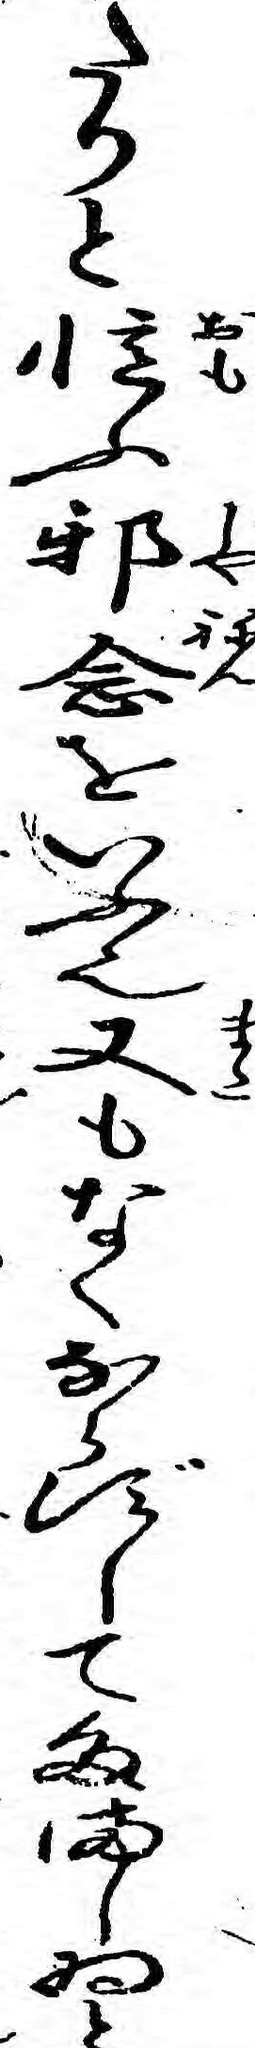たりと憶ふ邪念をいふ也又もなくならずしてたましゐと
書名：目なし用心抄
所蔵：国文学研究資料館
